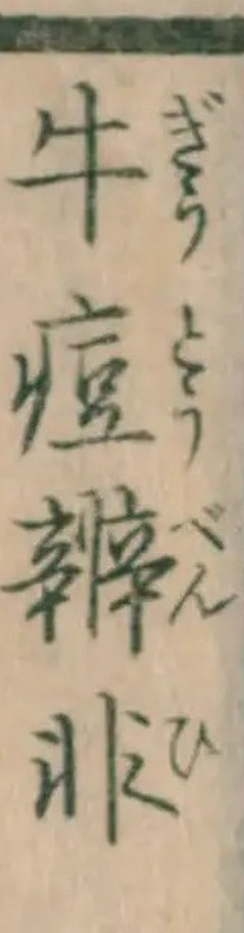牛痘辨非
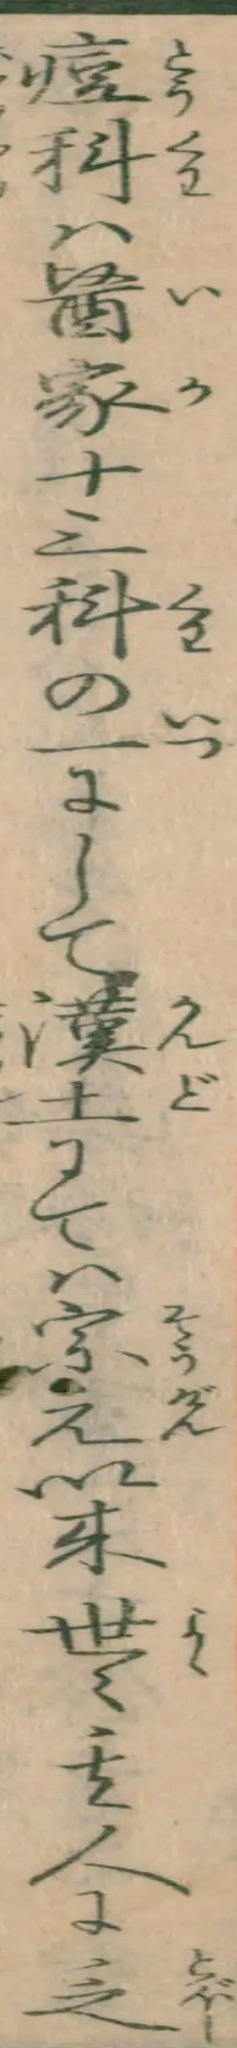痘科は醫家十三科の一にして漢土にては宋元以来世々其人に乏
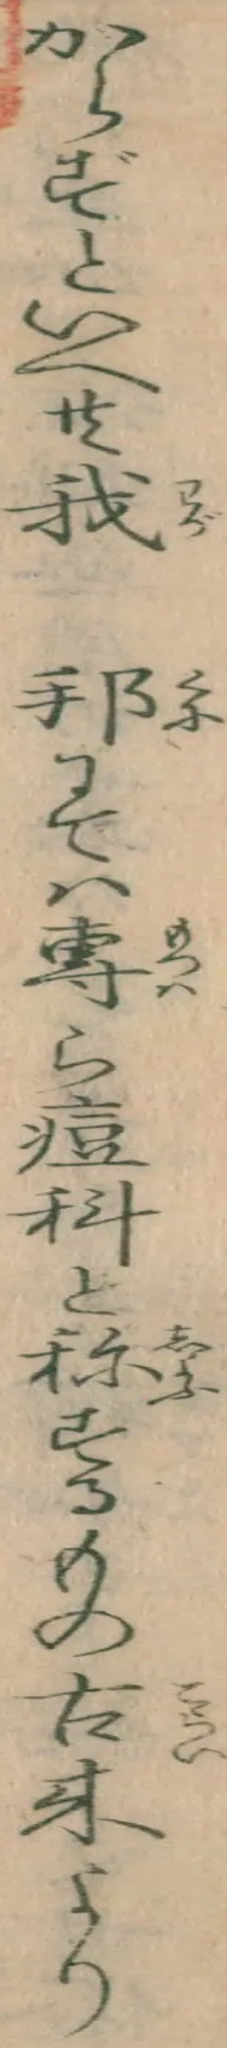からずといへ共我邦にては専ら痘科と称するもの古来より
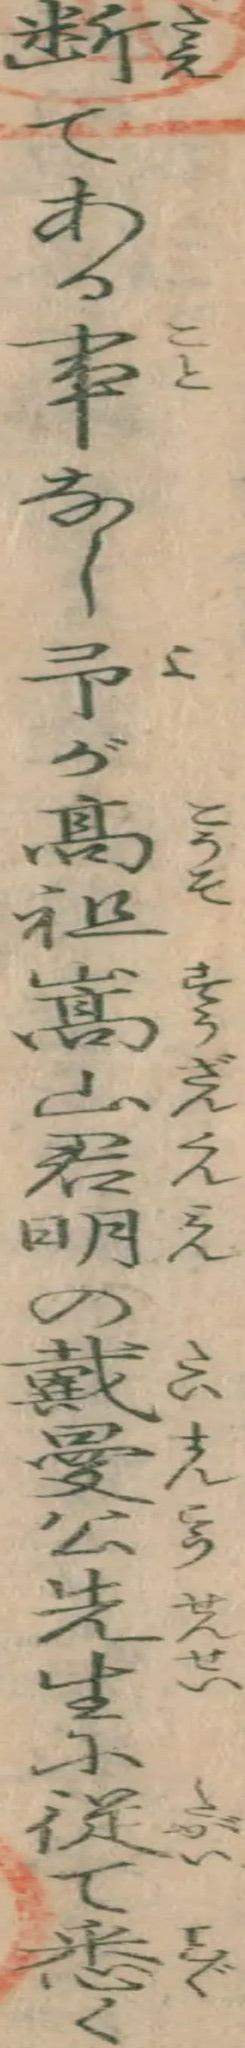断てある事なし予が高祖嵩山君明の載曼公園先生に従て悉く
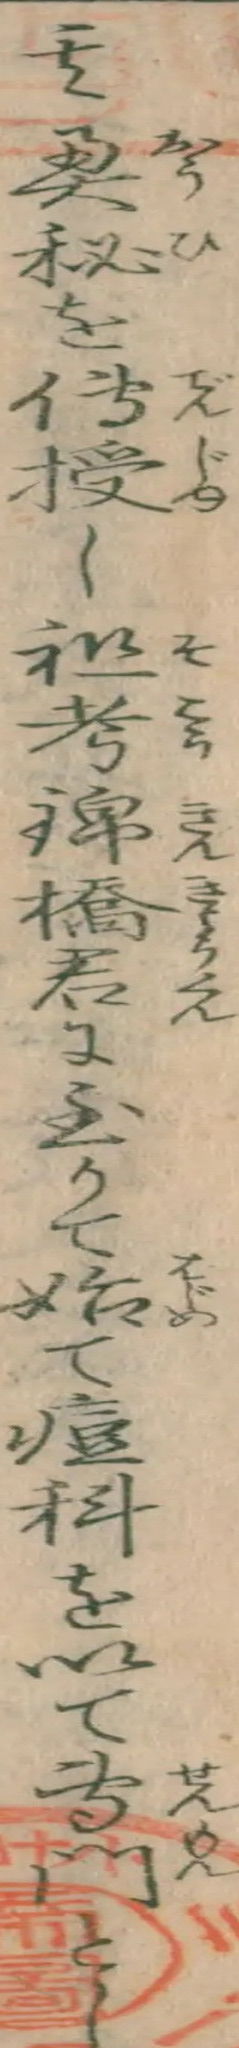其奥秘を伝授し祖考錦橋君に至りて始て痘科を以て専門とし
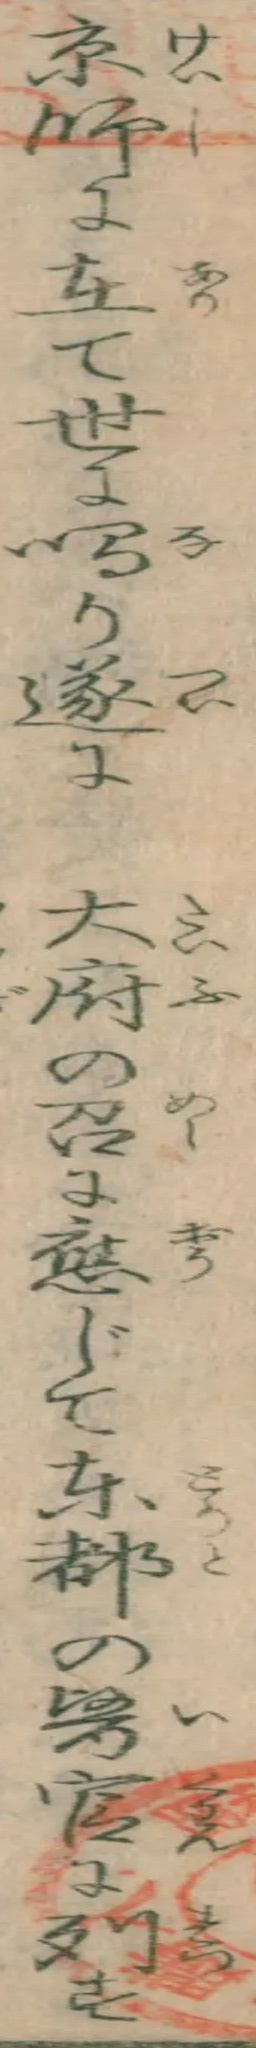京師に在て世に鳴り遂に太府の召に應じて東都の醫官に列す
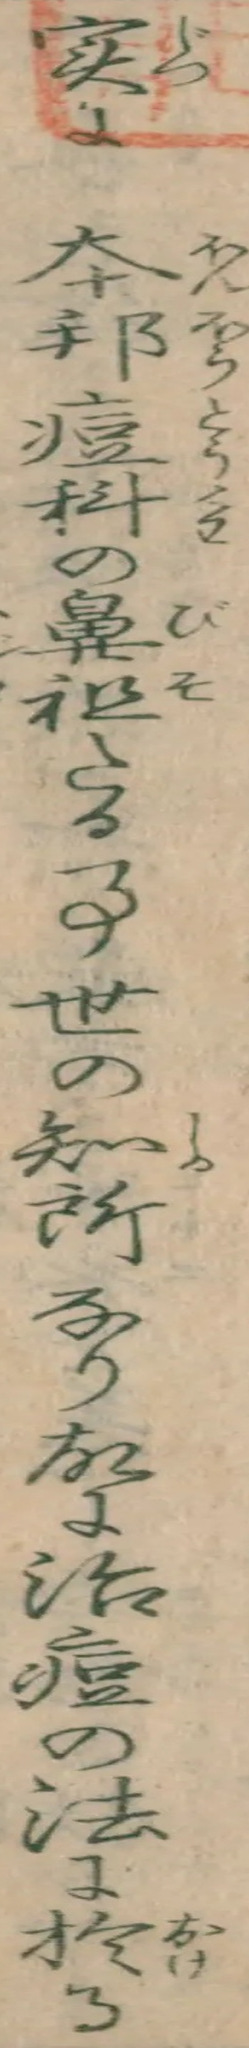実に本邦痘科の鼻祖たる事世の知所なり故に治痘の法に於る
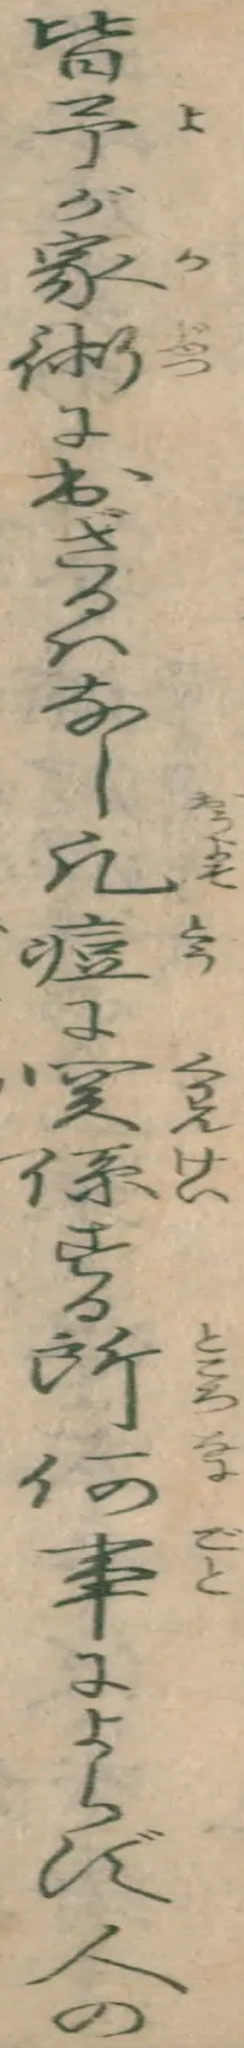皆予が家術におざるはなし凡痘に関係する所何事によらず人の
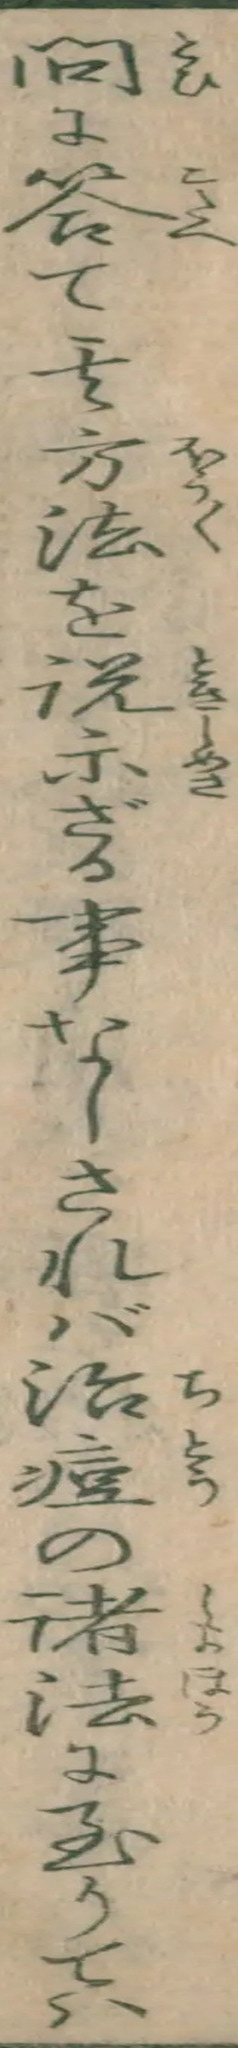問に答て其方法を説示ざる事なしされば治痘の諸法に至りては
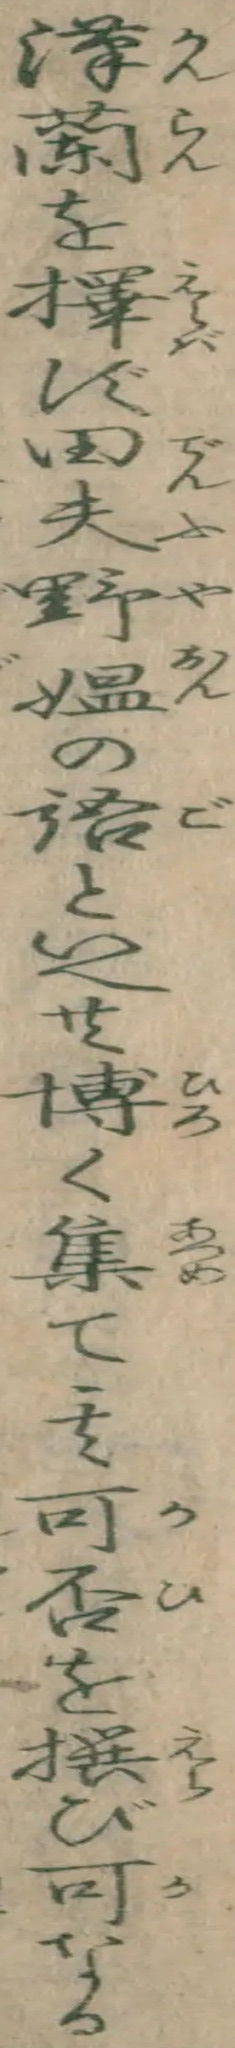漢蘭を擇ず田夫野媼の語といへ其博く集て其可否を撰び可なる

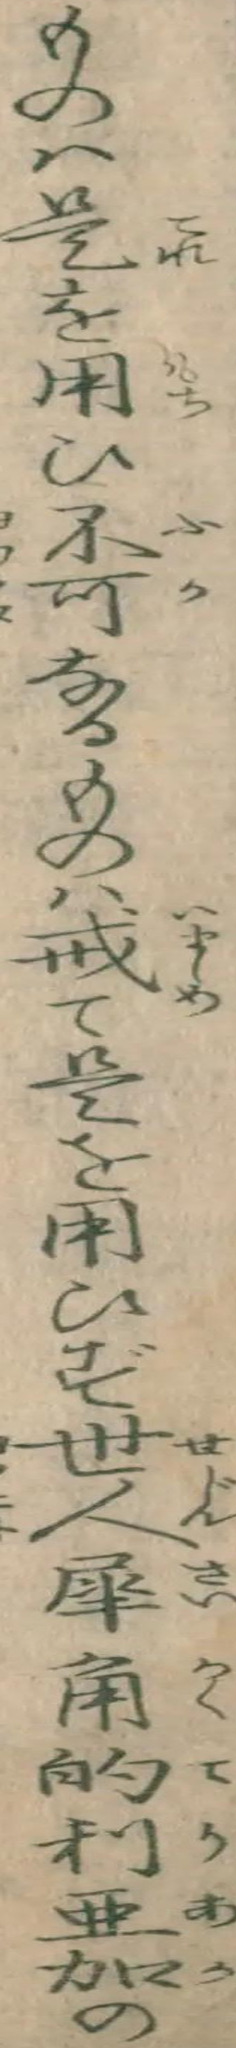ものは是を用ひ不可なるものは戒て是を用ひず世人犀角的利亜加の
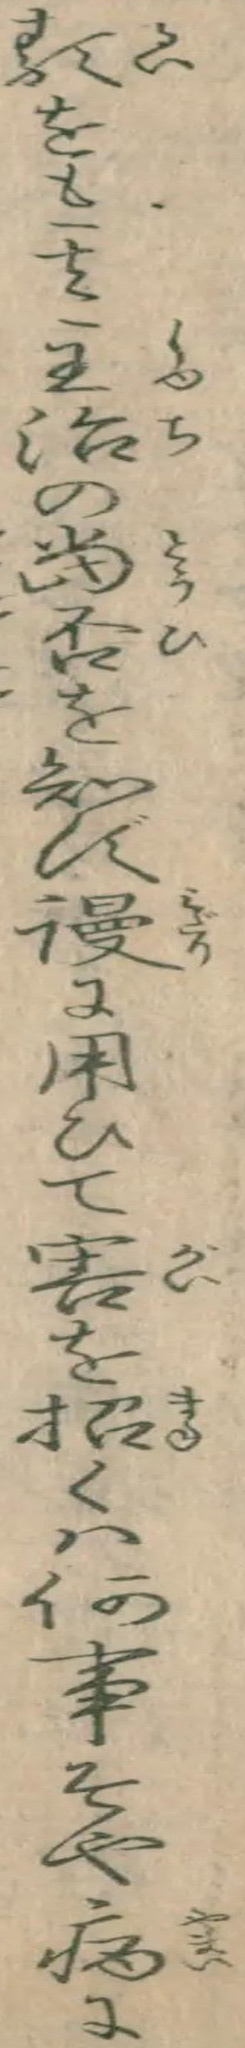類をも其主治の当否を知ず漫に用ひて害を招くは何事そや病に
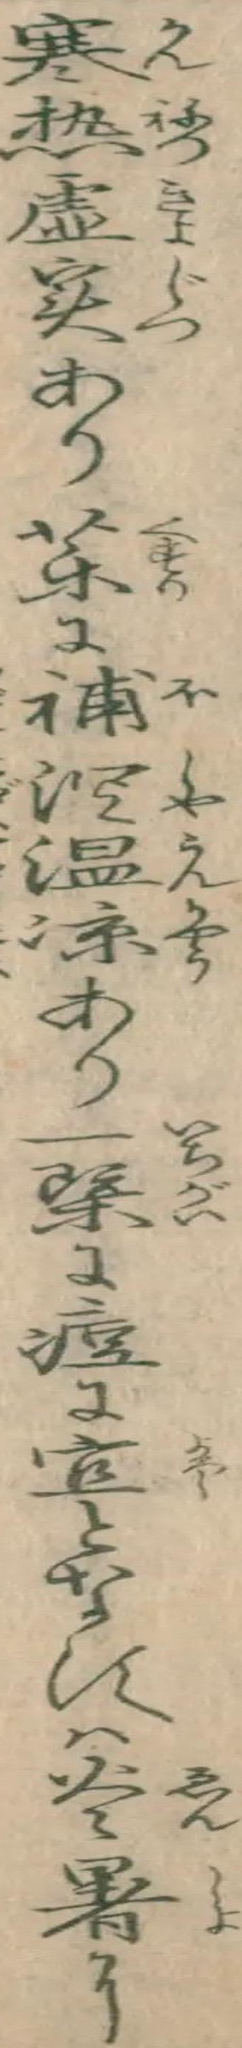寒熱虚実あり薬に補瀉温涼あり一既に痘に宜となすは炎暑より
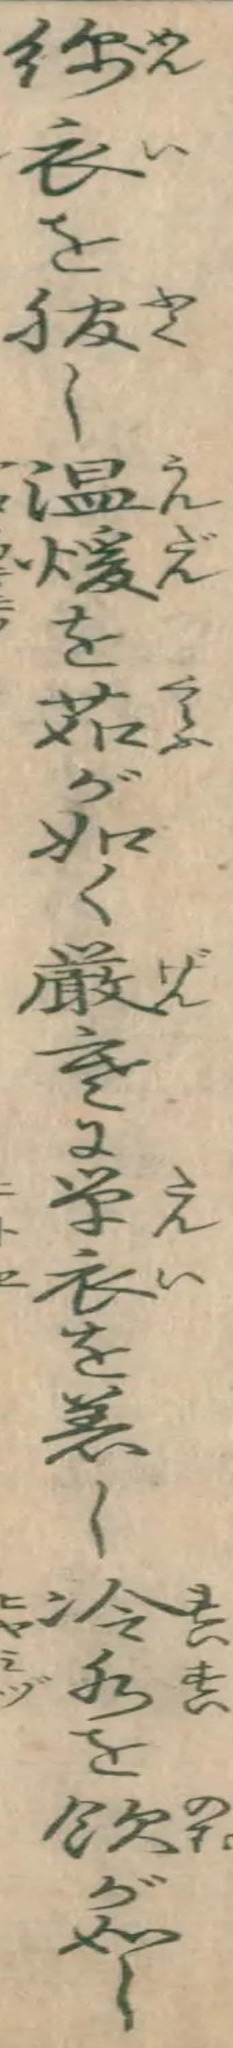綿を抜し温煖を茹が如く厳寒に単衣を着し冷水を飲が如し
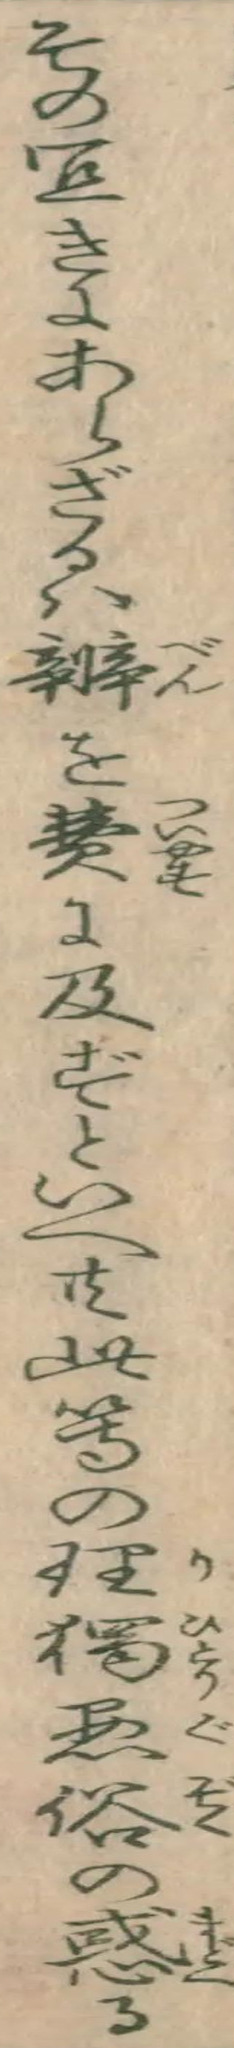その宜きにあらざるは辨を費に及ずといへ共此等の理獨愚俗の惑る
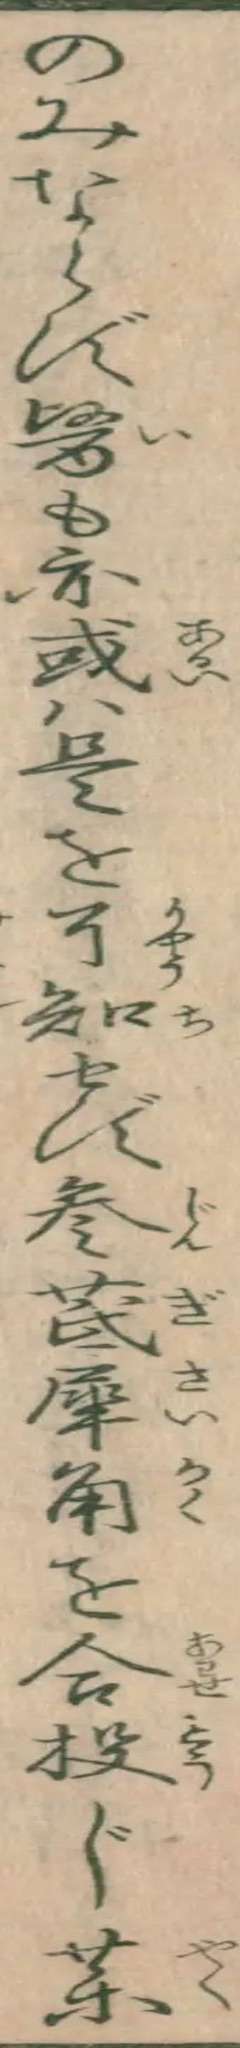のみならず醫も亦或は是を了知せず参茋犀角を合投じ薬
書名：牛痘辨非
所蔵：国立国会図書館 National Diet Library, JAPAN
